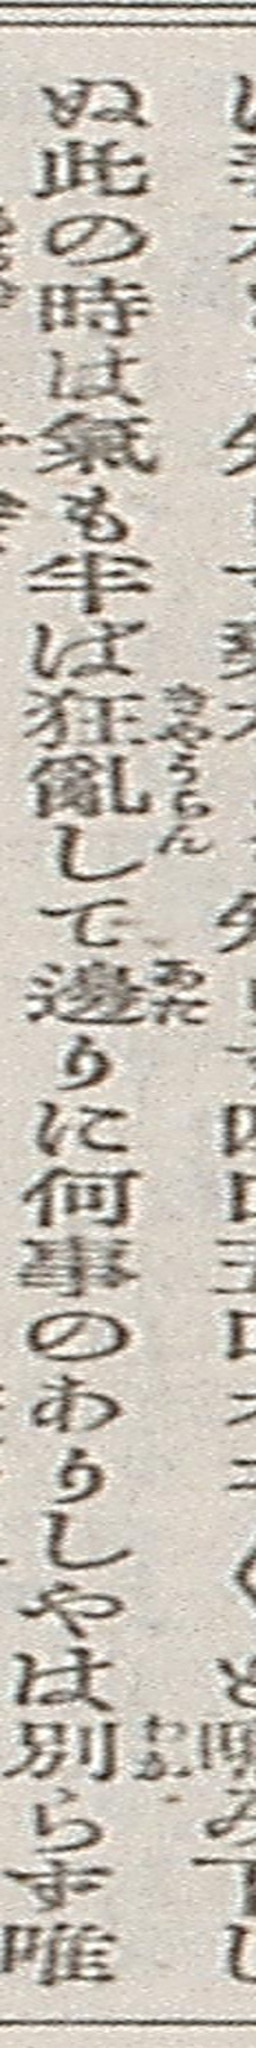ぬ此の時は気も半ば狂乱して辺りに何事のありしやは別らず唯
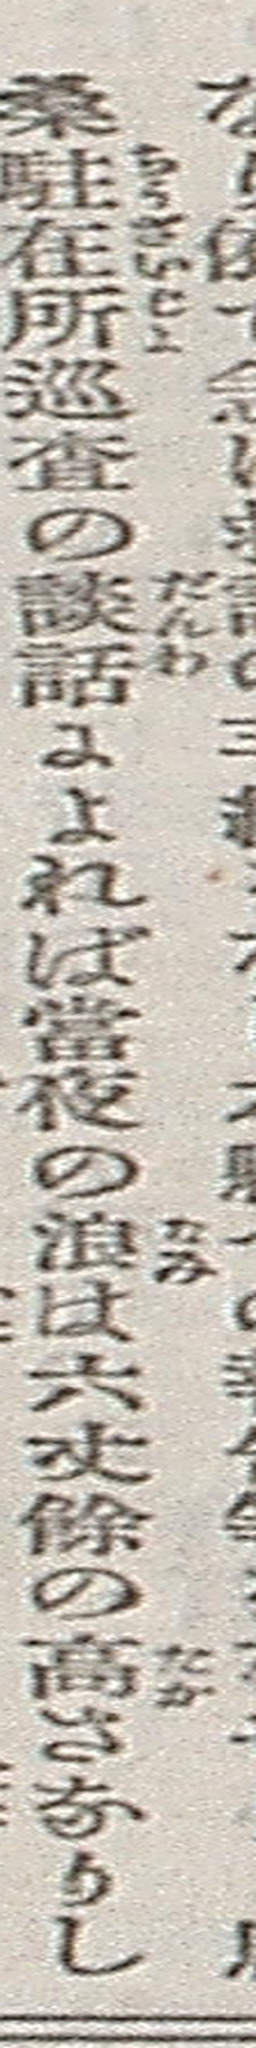桑駐在所巡査の談話によれば当夜の浪は六丈余の高さなりし
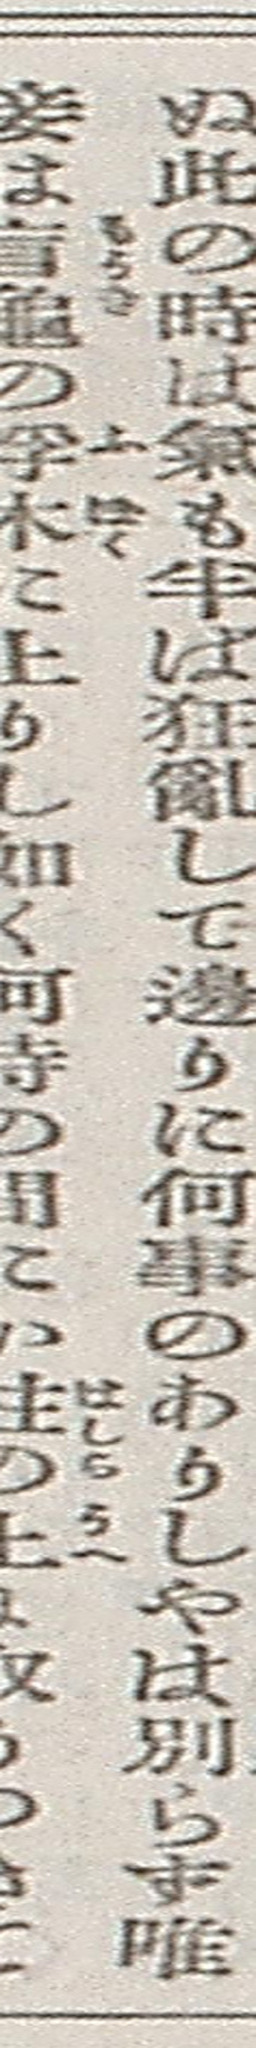妾は盲亀の浮木に上りし如く何時の間にか柱の上に取りつきて
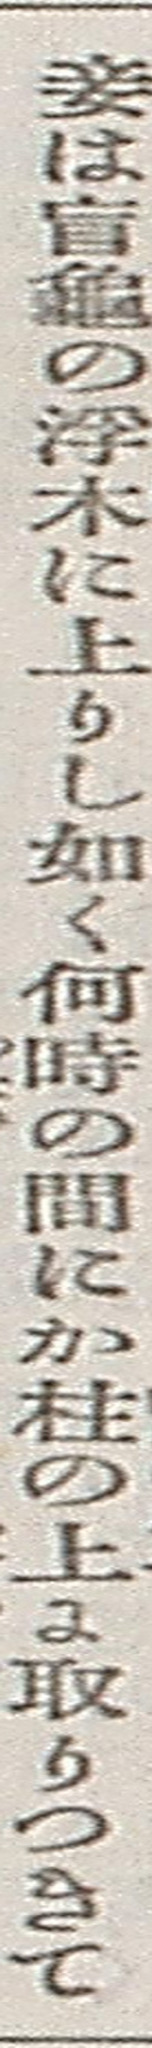妾は盲亀の浮木に上りし如く何時の間にか柱の上に取りつきて
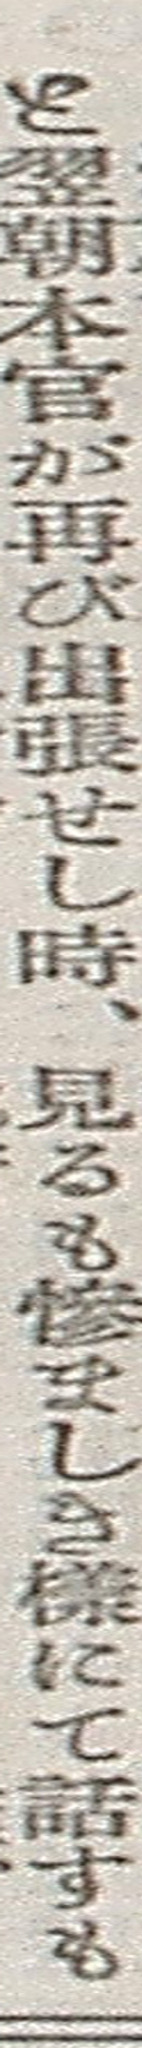と翌朝本官が再び出張せし時、見るも惨ましき様にて話すも
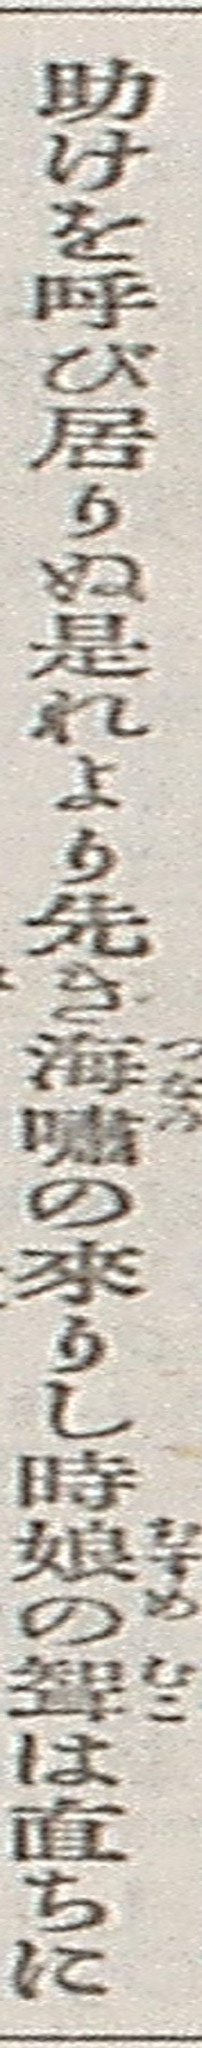助けを呼び居りぬ是れより先き海嘯の来りし時娘の聟は直ちに
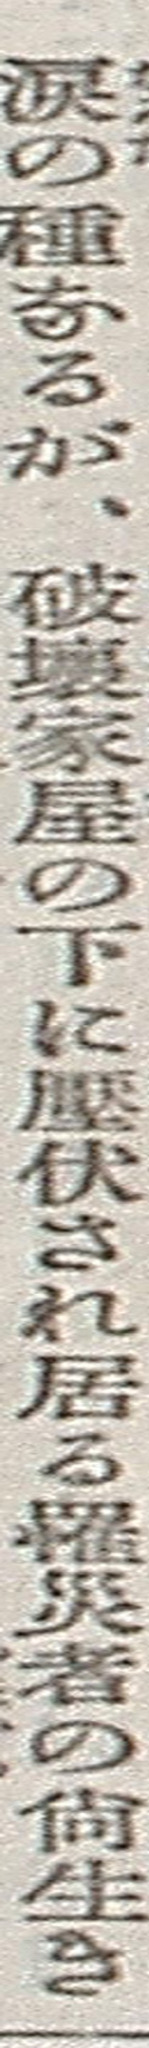涙の種なるが、破壊家屋の下に圧伏され居る罹災者の尚生き
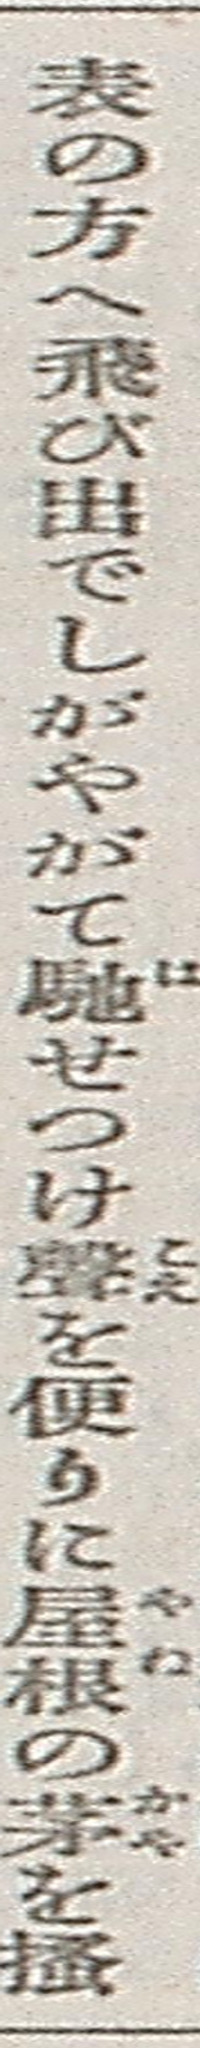表の方へ飛び出でしがやがて馳せつけ声を便りに屋根の茅を掻
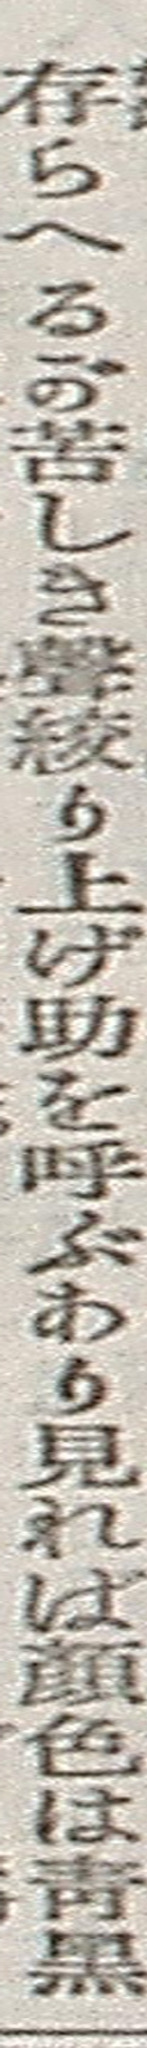存らへるが苦しき声絞り上げ助を呼ぶあり見れば顔色は青黒
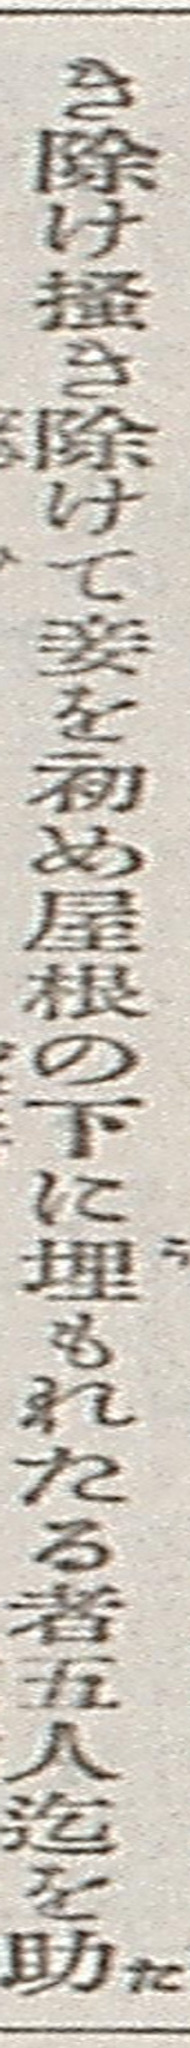き除け掻き除けて妾を初め屋根の下に埋もれたる者五人迄を助
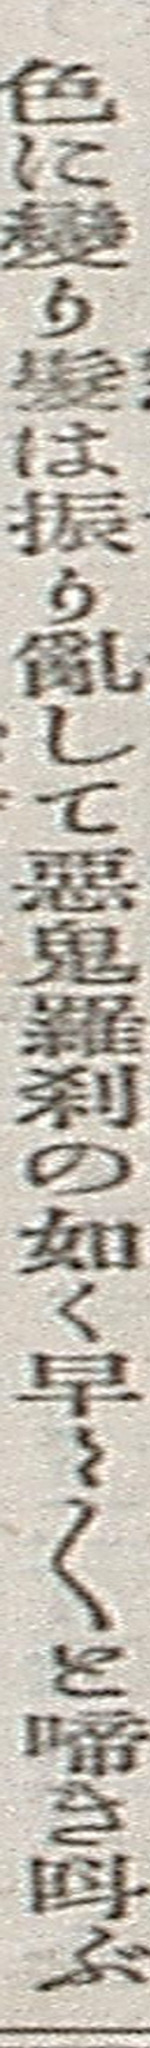色に変り髪は振り乱して悪鬼羅刹の如く早々〳〵と啼き叫ぶ
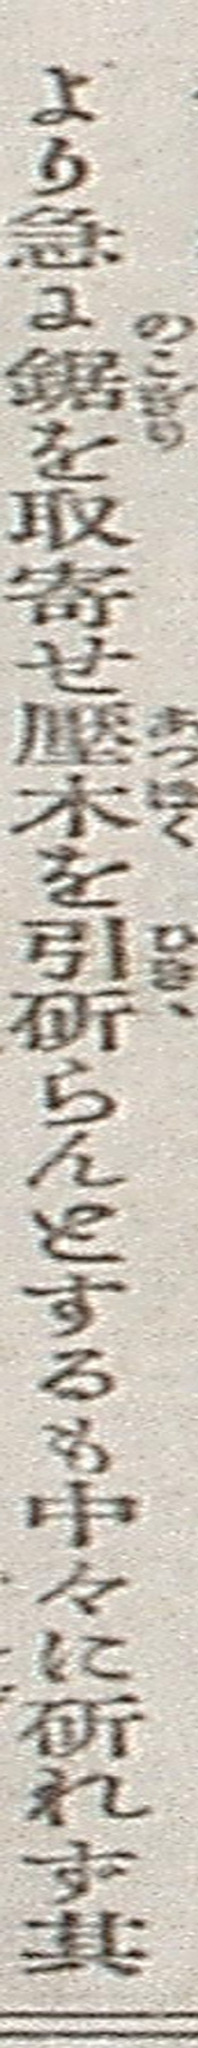より急に鋸を取寄せ圧木を引斫らんとするも中々に析れず其
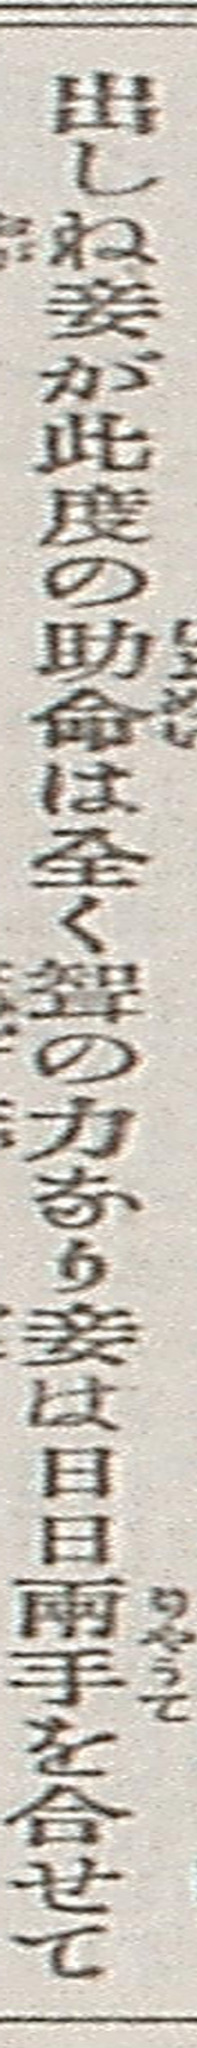出しね妾が此度の助命は全く聟の力なり妾は日日両手を合せて
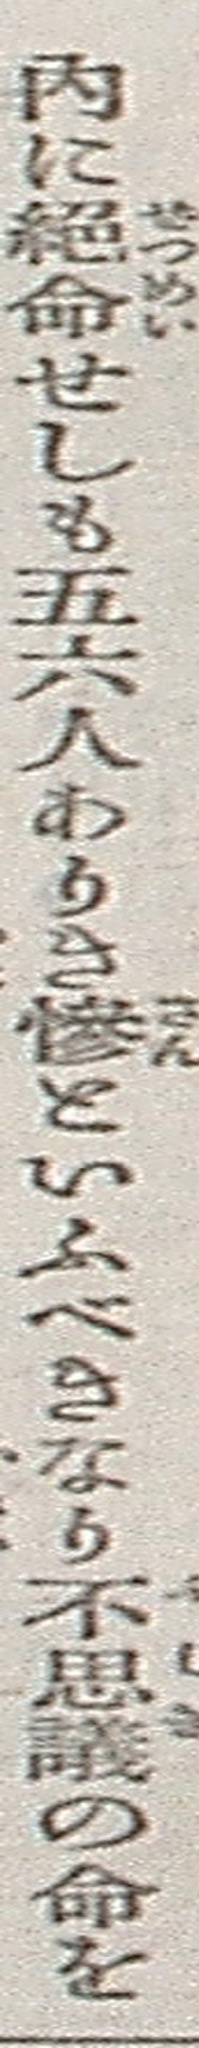内に絶命せしも五六人ありき惨といふべきなり不思議の命を
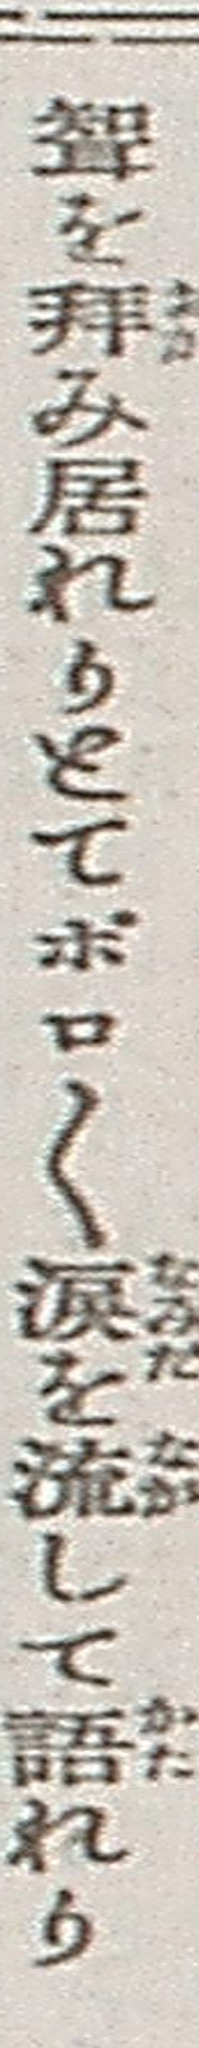聟を拝み居れりとてポロ〳〵涙を流して語れり
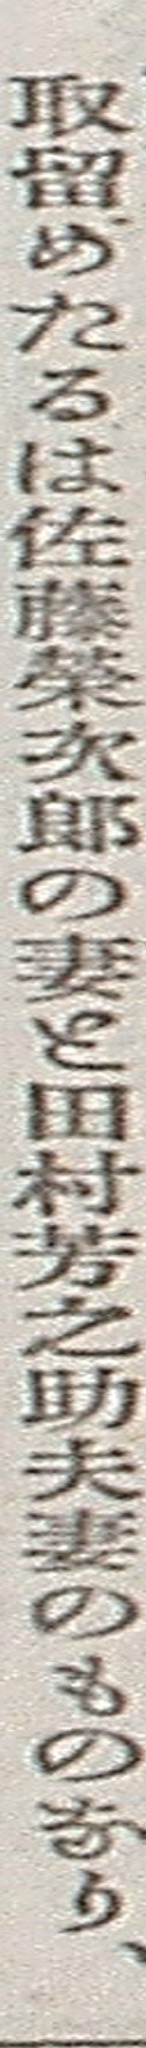取留めたるは佐藤栄次郎の妻と田村芳之助夫妻のものなり、
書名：風俗畫報臨時増刊第百十九號　大海嘯被害録（中）
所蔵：東京大学地震研究所図書室 Earthquake Research Institute Library, The University of Tokyo, JAPAN
